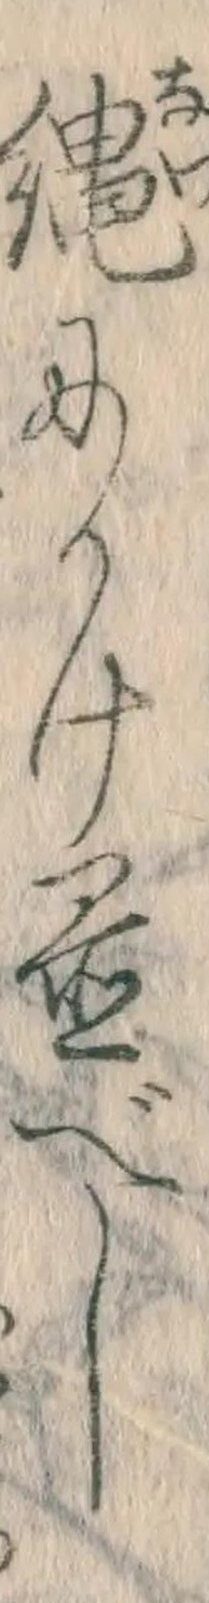縄にかけ置べし
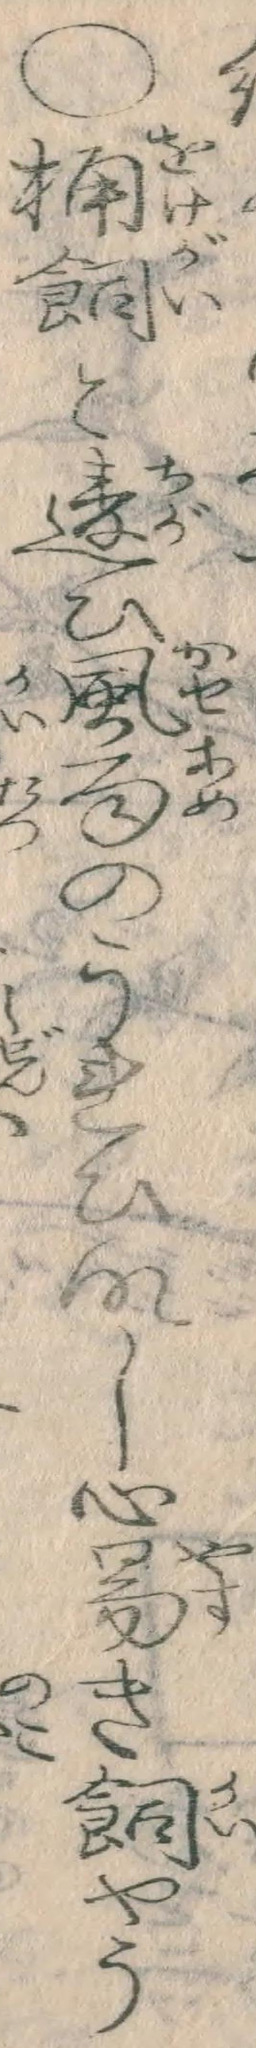○桶飼と違ひ風雨のうれひなし心易き飼やう
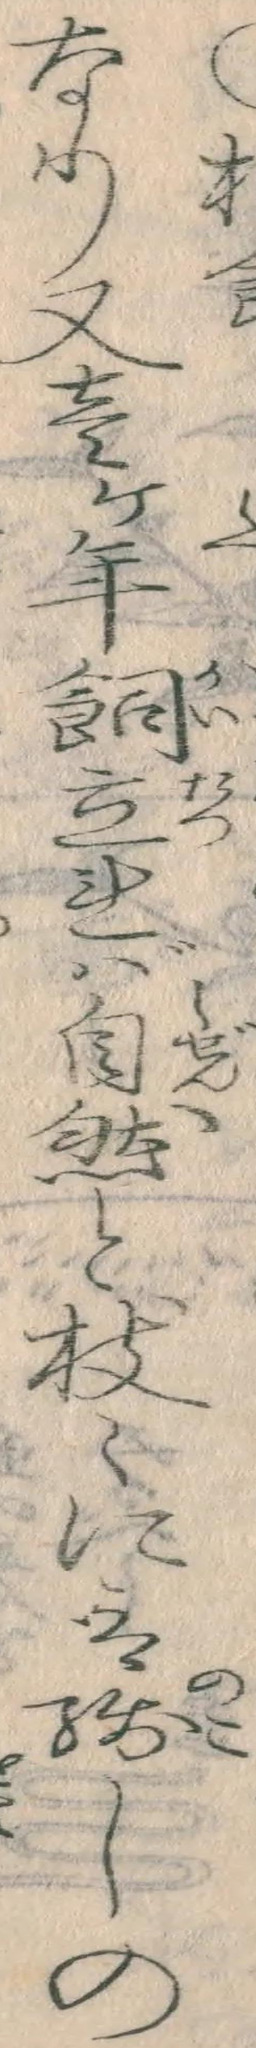なり又壱ヶ年飼立れば自然と枝々には残しの
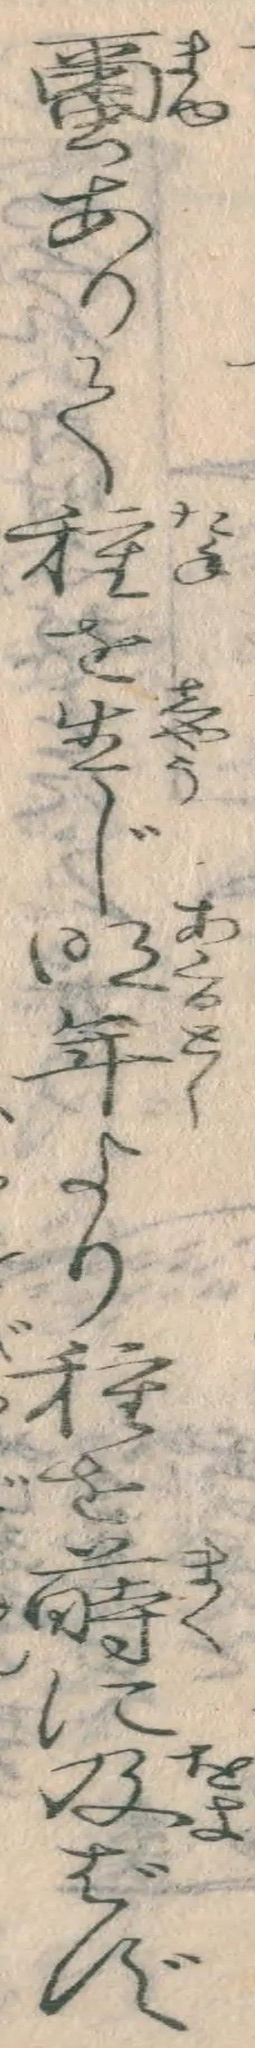繭ありて種を生じ明年より種を蒔に及ばず
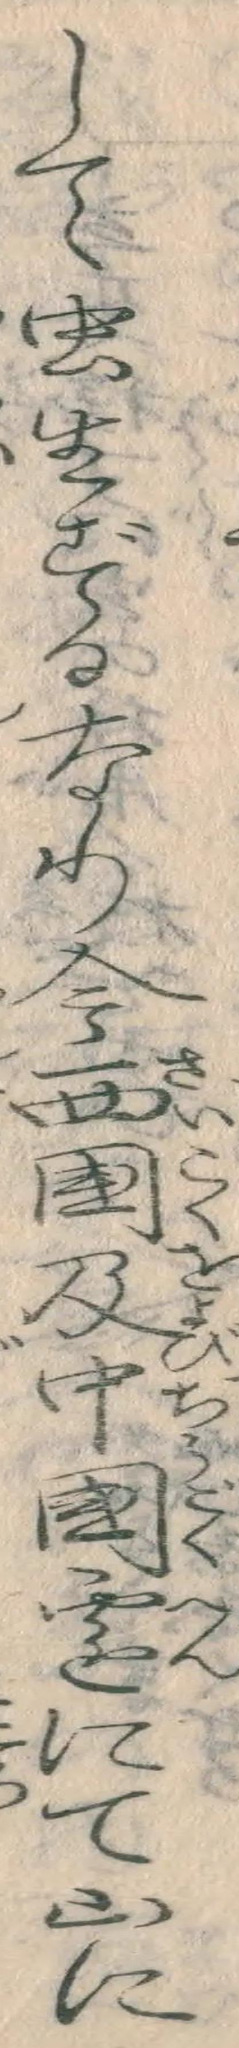して虫生ずるなり今西国及中国辺にて山に
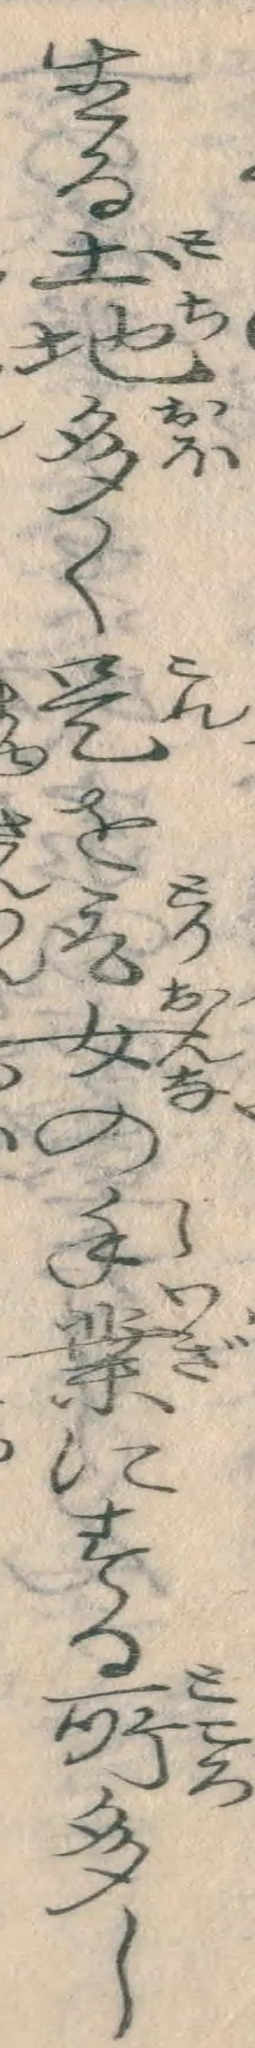生る土地多く是を取女の手業にする所多し
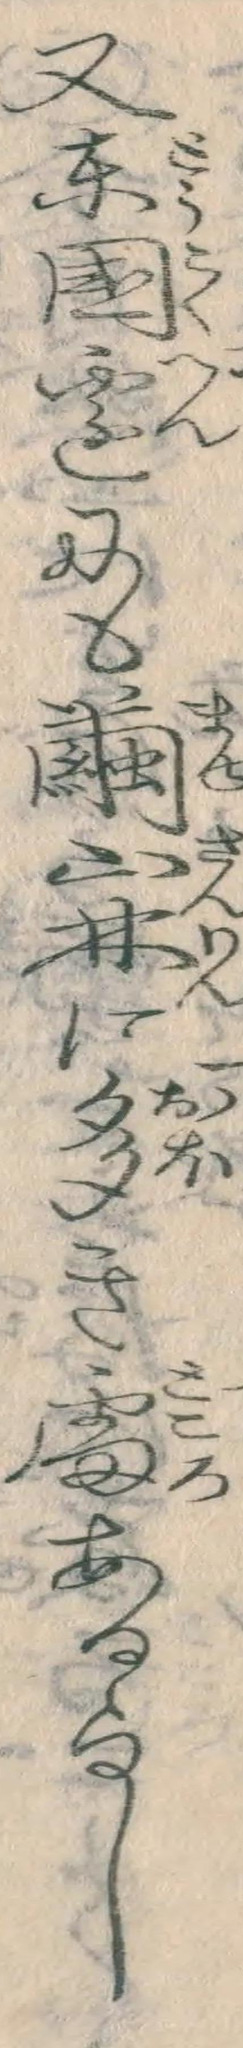又東国辺にも繭山林に多き処あるよし

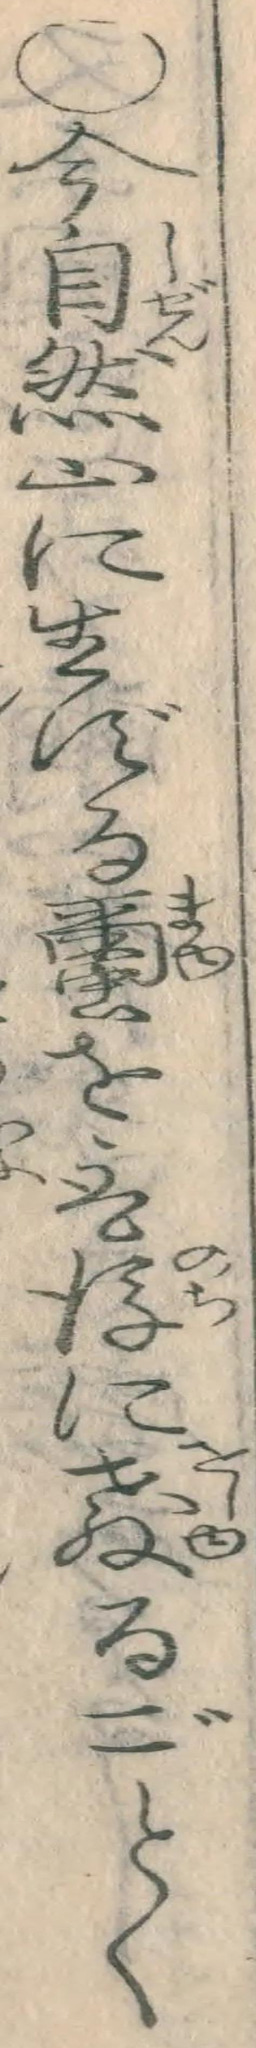○今全山に生ずる繭を取後に教るごとく
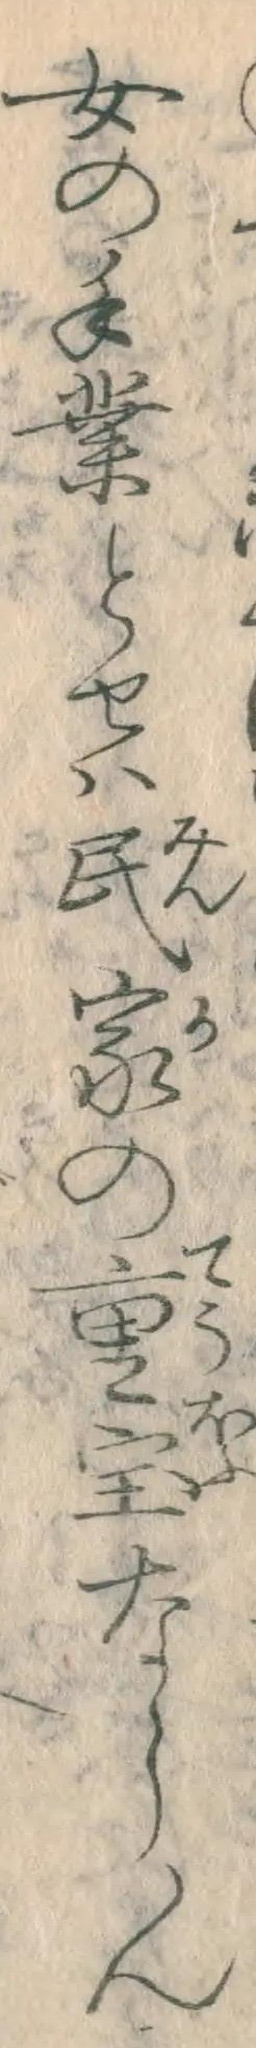女の手業とせは民家の重宝ならん
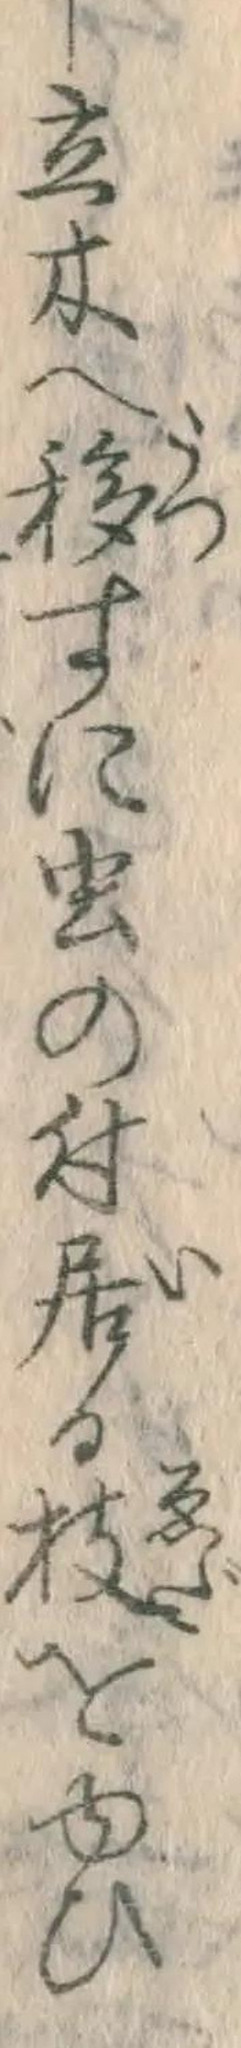立木へ移すに虫の付居る枝をゆひ
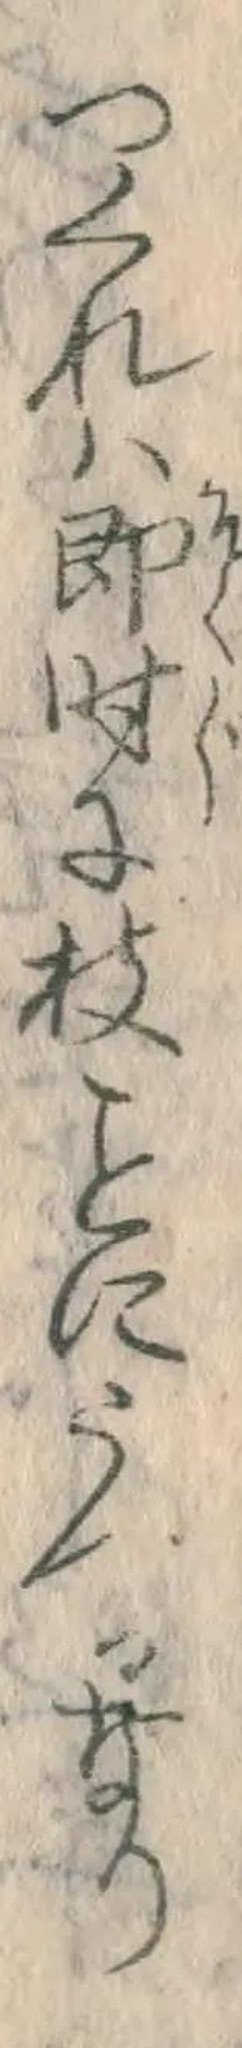つくれは即時に枝ことにうつるなり
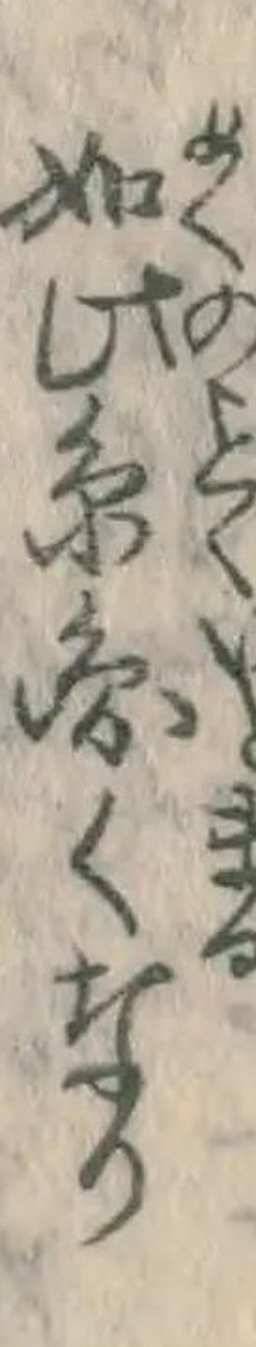如此糸円くなり
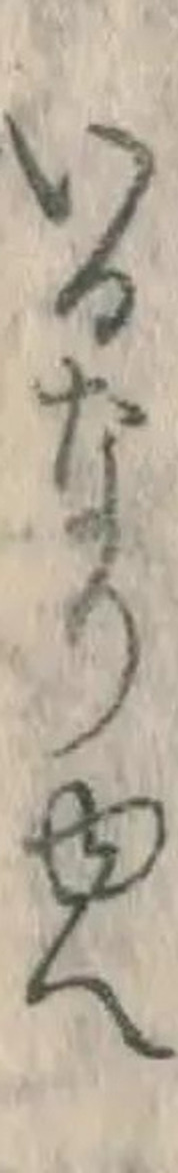いるなりゆへ
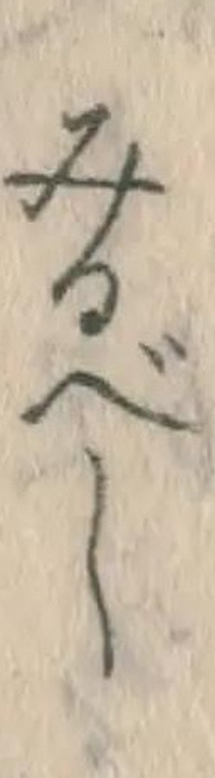みるべし
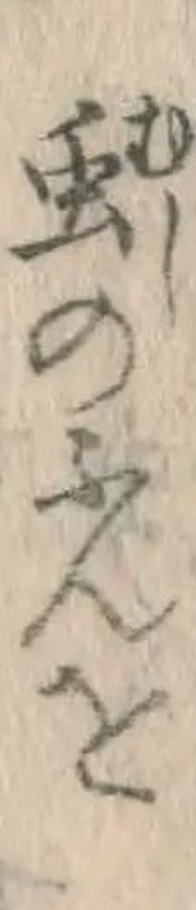虫のふんと
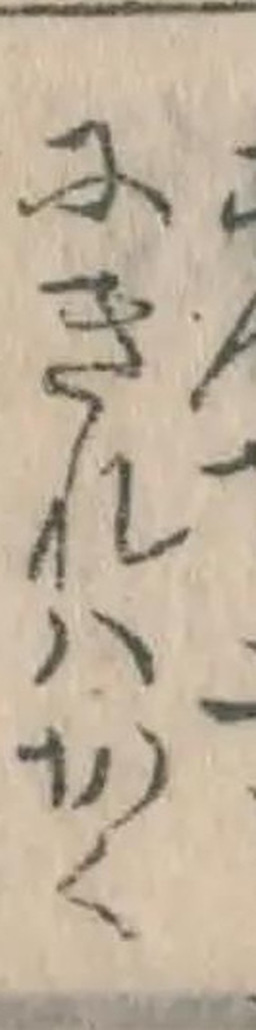にきれはかく
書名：山繭養法秘傳抄
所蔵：国立国会図書館 National Diet Library, JAPAN
